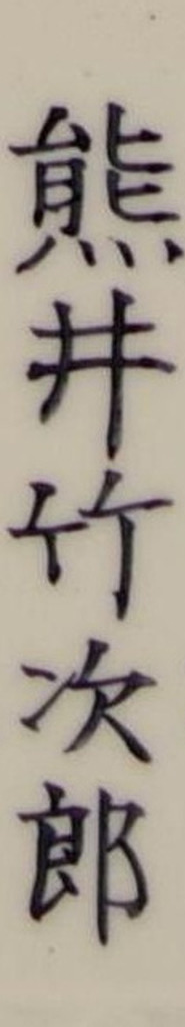熊井竹次郎
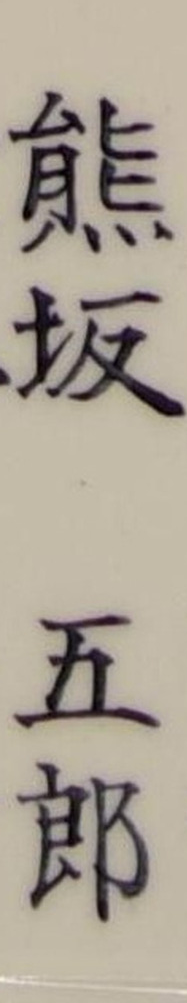熊坂五郎
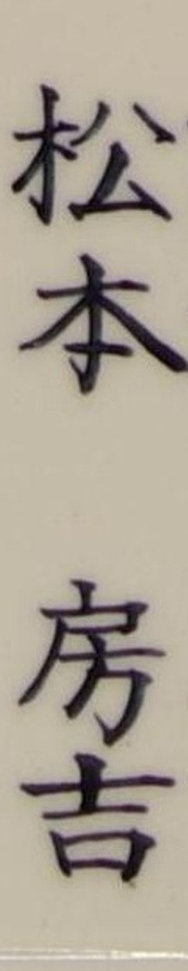松本房吉
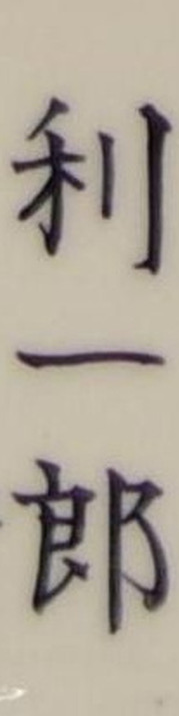利一郎
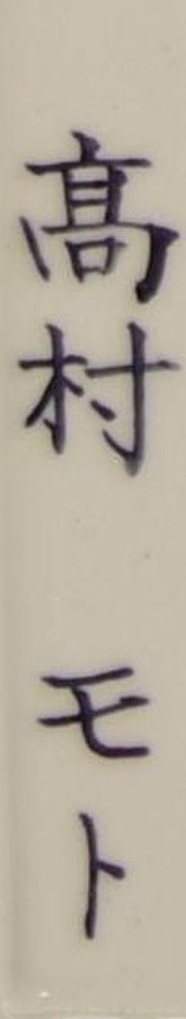高村モト

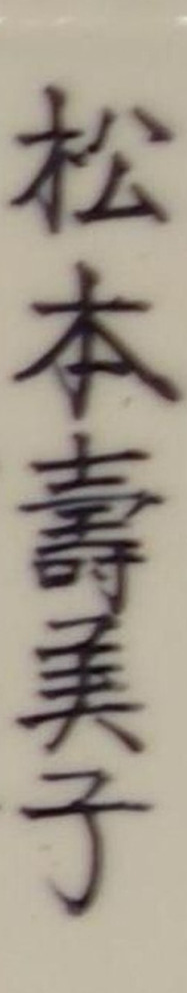松本壽美子
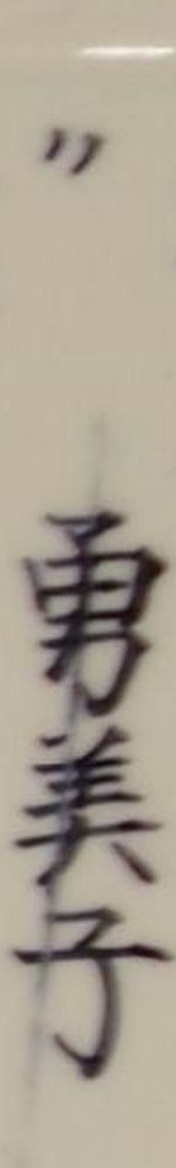勇美子
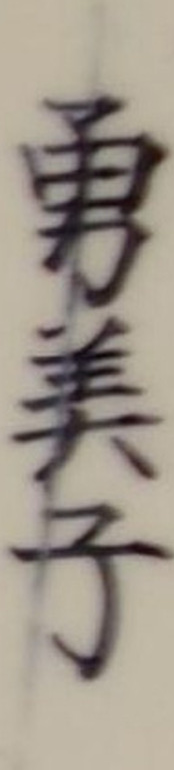勇美子
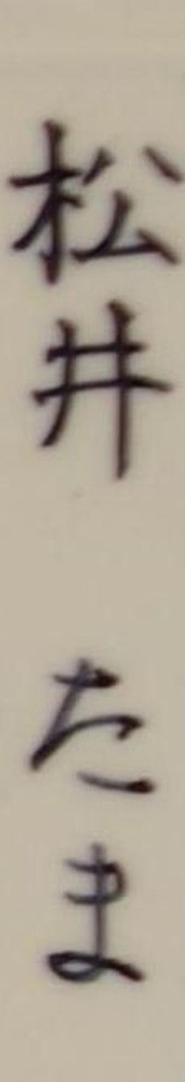松井たま
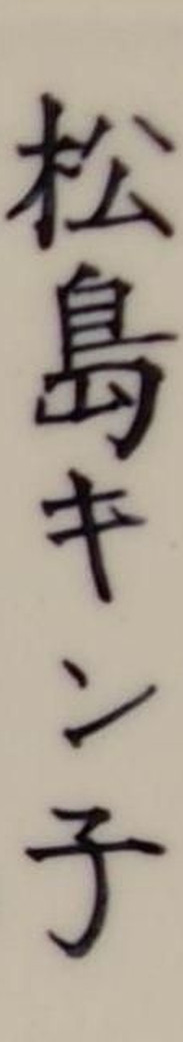松島キン子
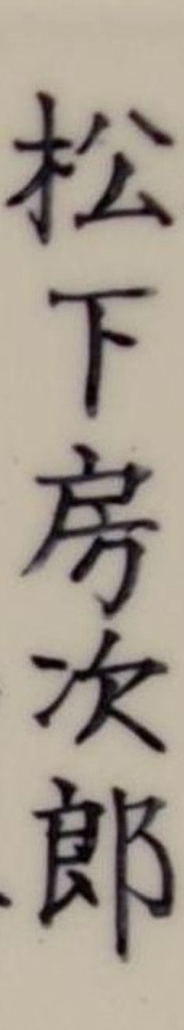松下房次郎
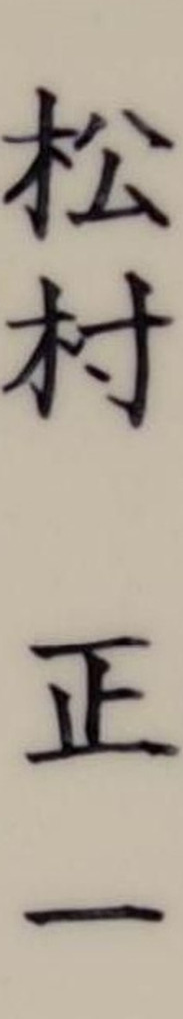松村正一
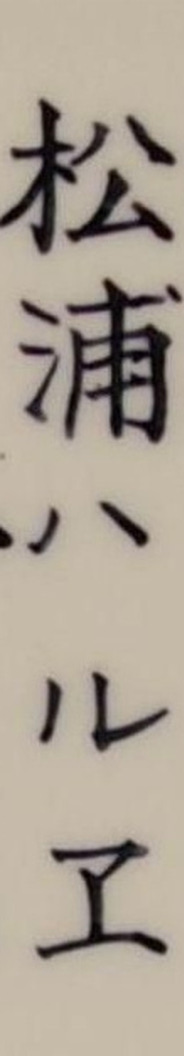松浦ハルエ
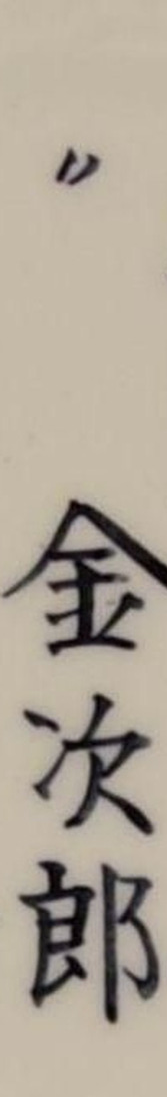金次郎
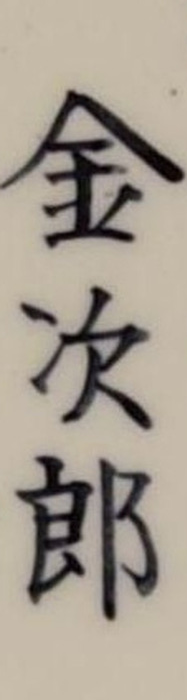金次郎
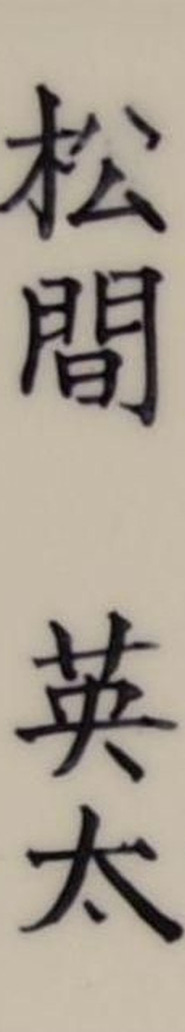松間英太
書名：E~L
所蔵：高野山金剛峯寺
